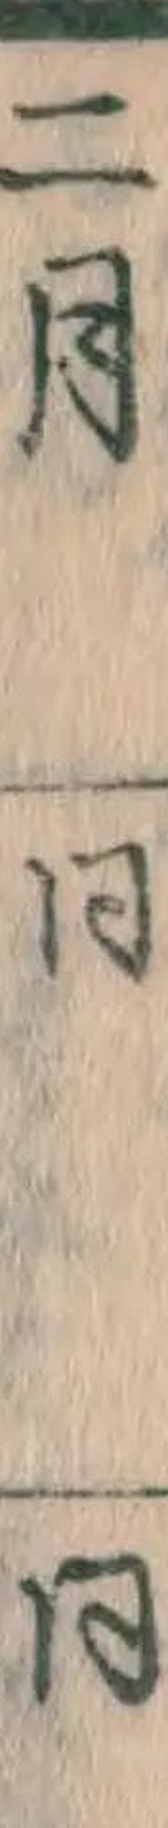二月同同
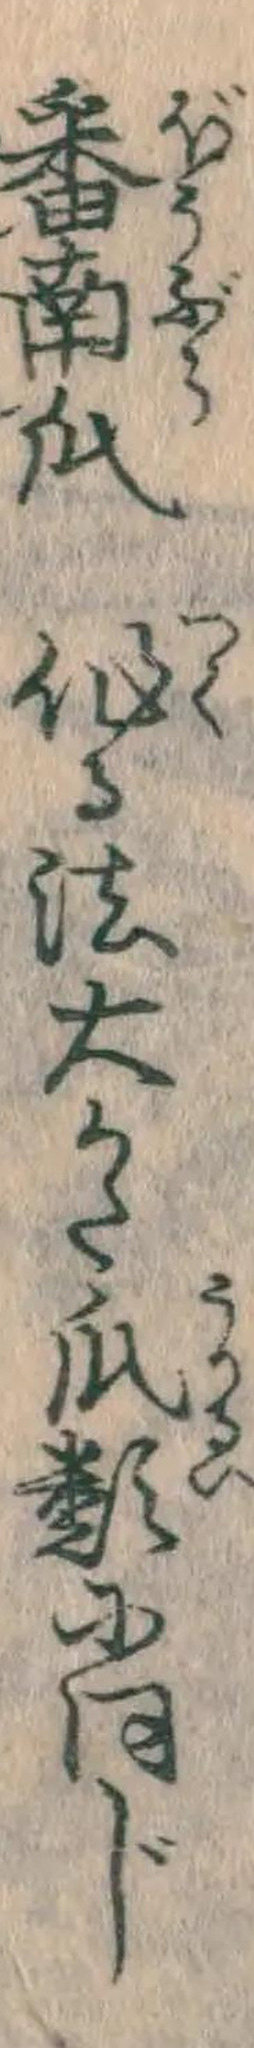番南瓜作る法大かた瓜類に同じ
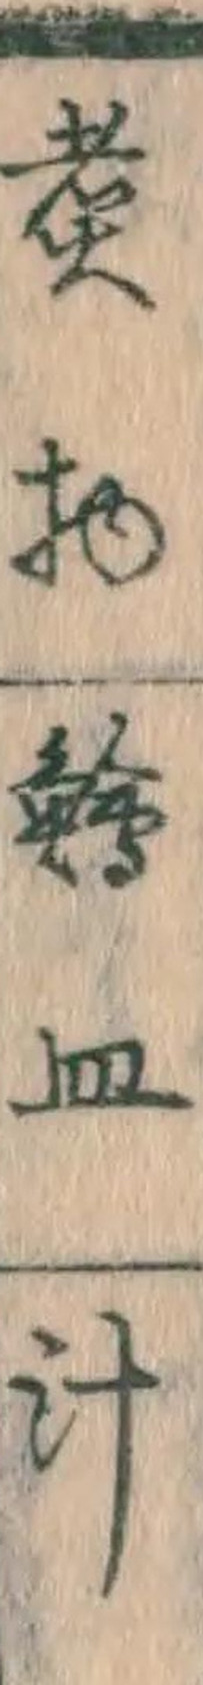煮物鱠皿汁
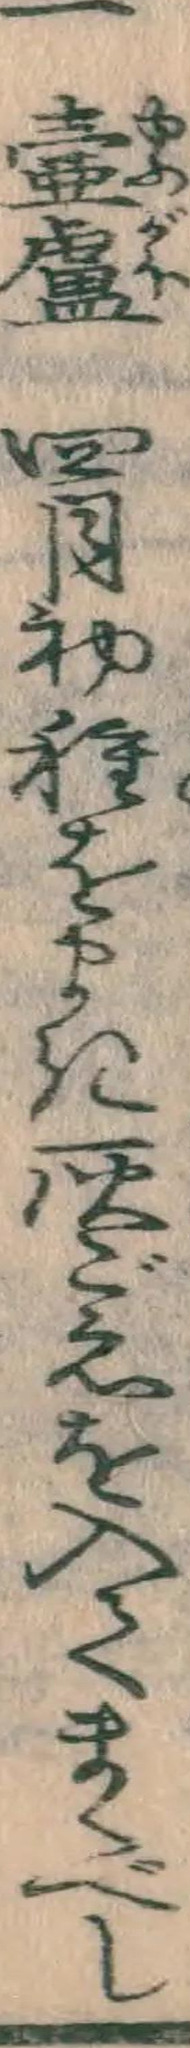一壷盧四月初種をまき灰ごえを入てまくべし
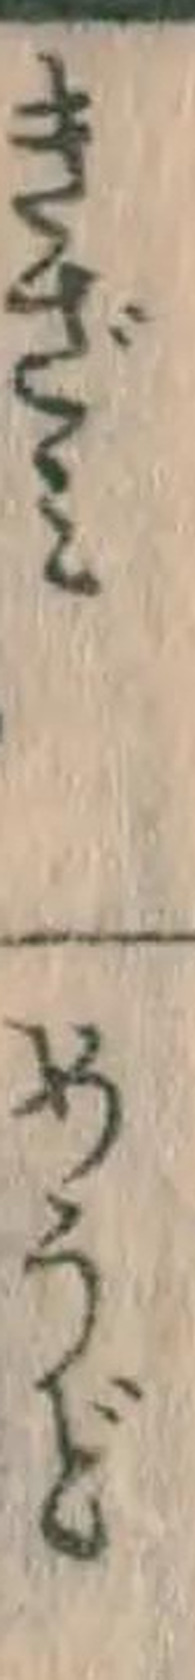きざみめうど
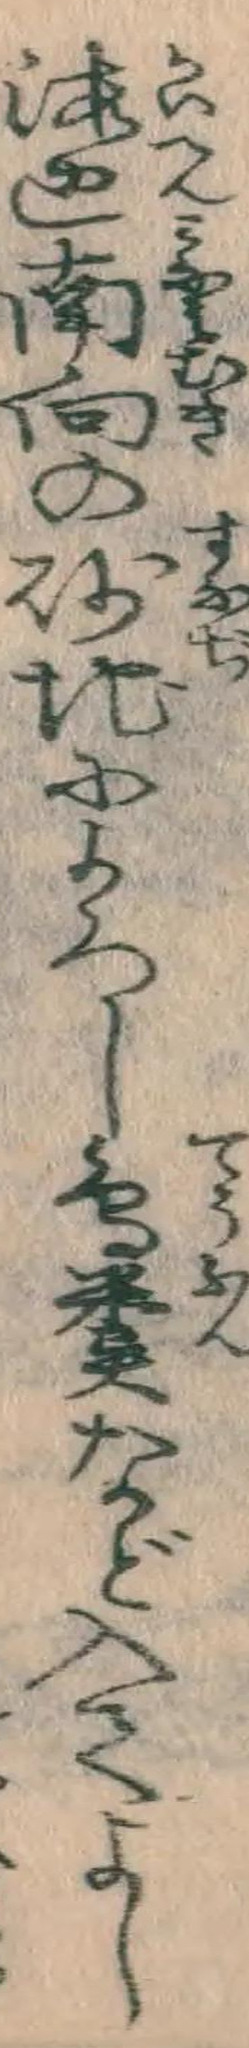海辺南向の砂地によろし鳥糞など入てよし
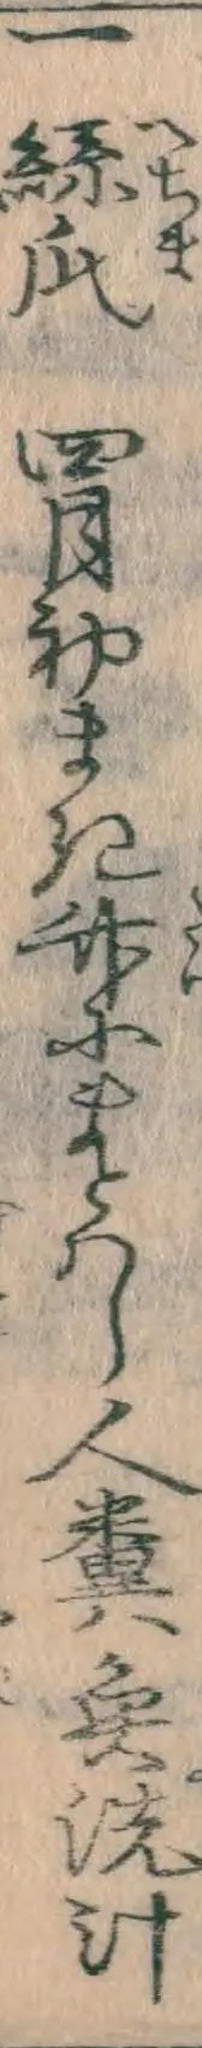一糸瓜四月初まき竹にまとはし人糞魚洗汁
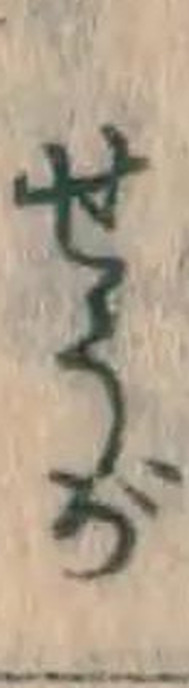せうが
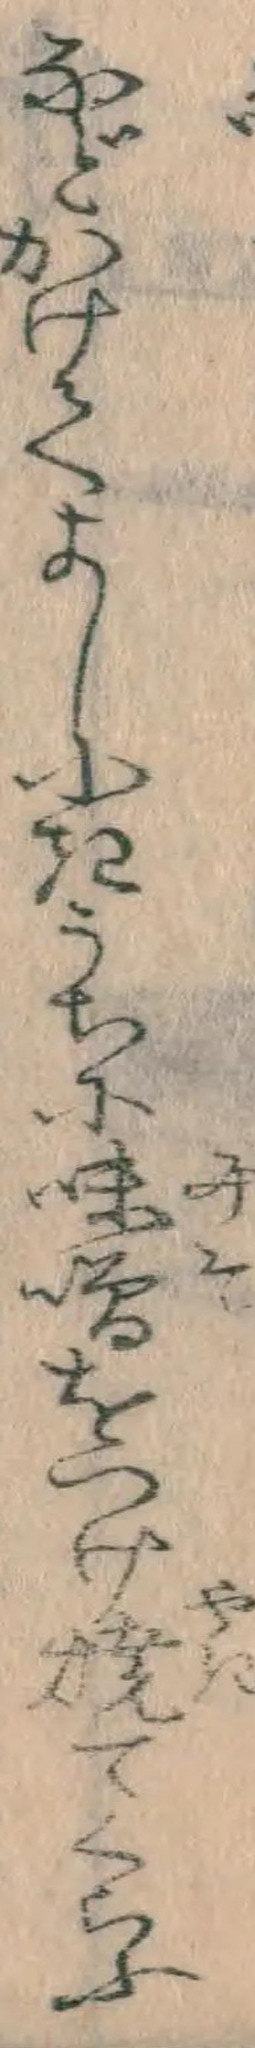などかけてよし小きうちに味噌をつけ焼てくらふ
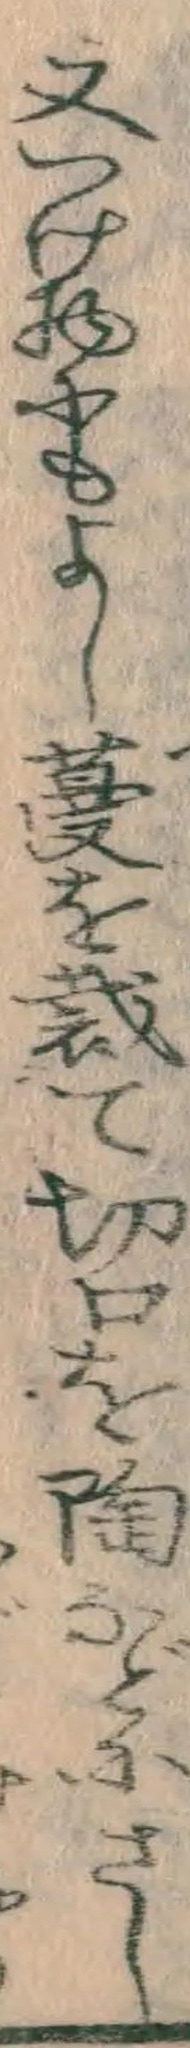又つけ物にもよし蔓を裁て切口を陶などにさし
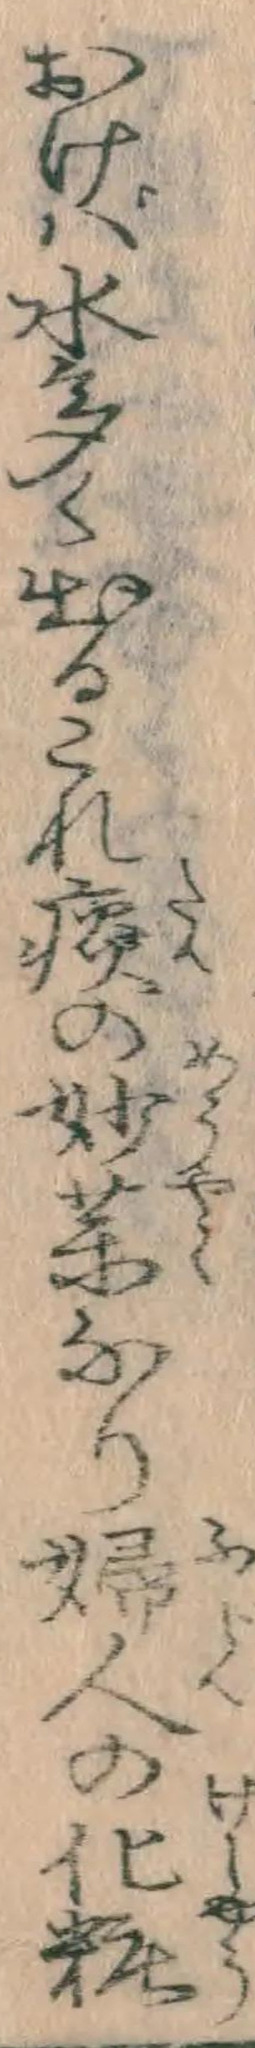おけば水多く出るこれ痰の妙薬なり婦人の化粧
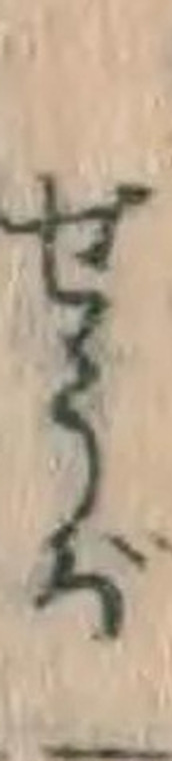せうが
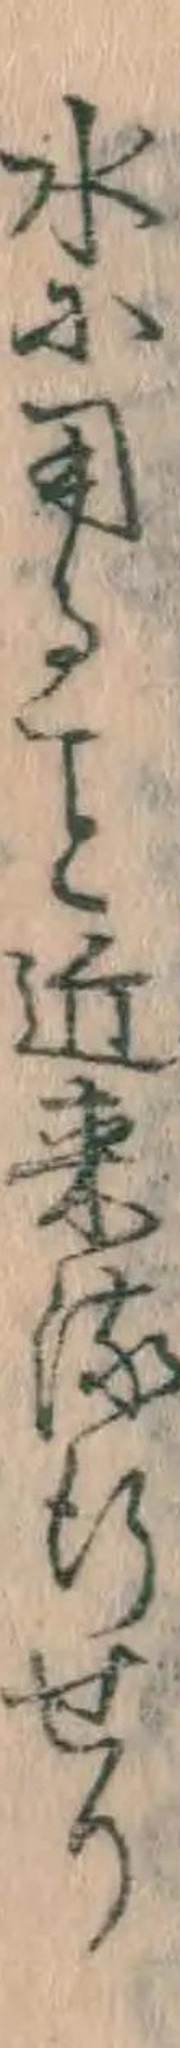水に用ること近来流行せり
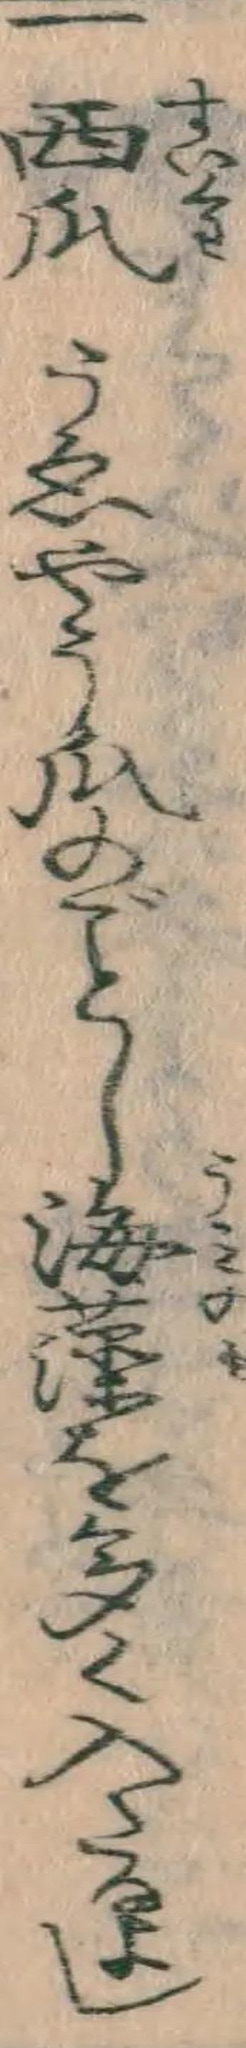一西瓜うゑやう瓜のごとし海藻を多く入たるよし
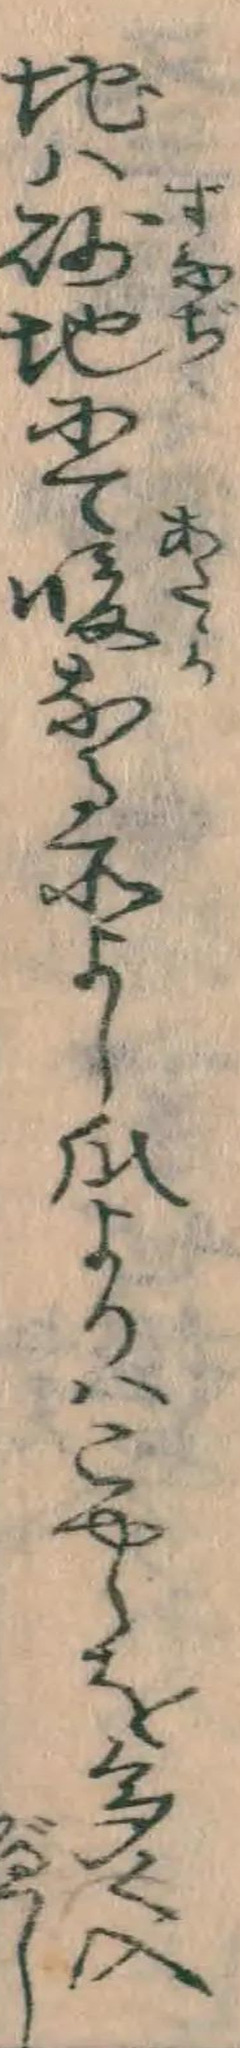地は砂地にて暖なる所よし瓜よりはこやしを多く入べし
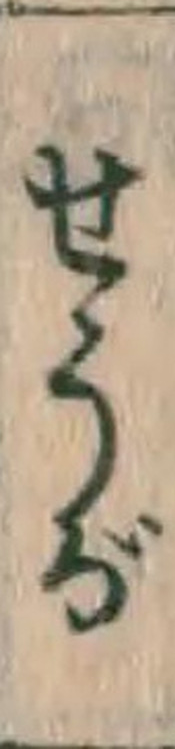せうが
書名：広益秘事大全 3巻. [5]
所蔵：国立国会図書館 National Diet Library, JAPAN
